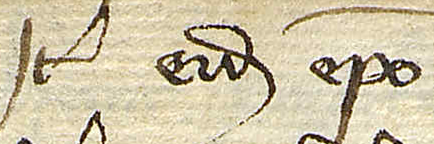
It* eid epo*
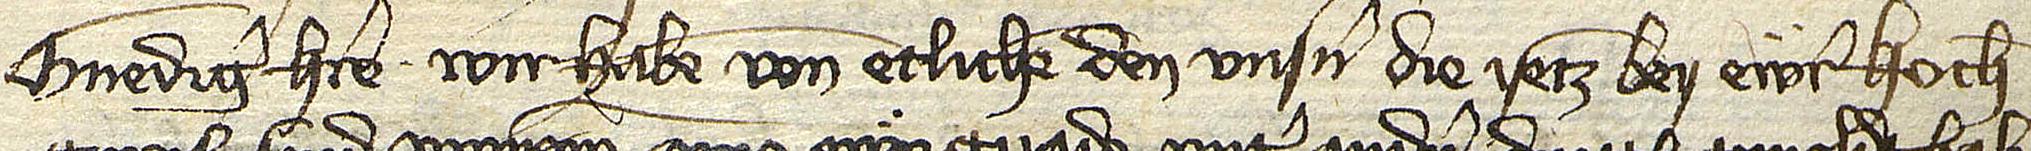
Gnedig* h*re . wir habe* von etliche* den vnſ*n die yecʒ* bey ew*r hoch*
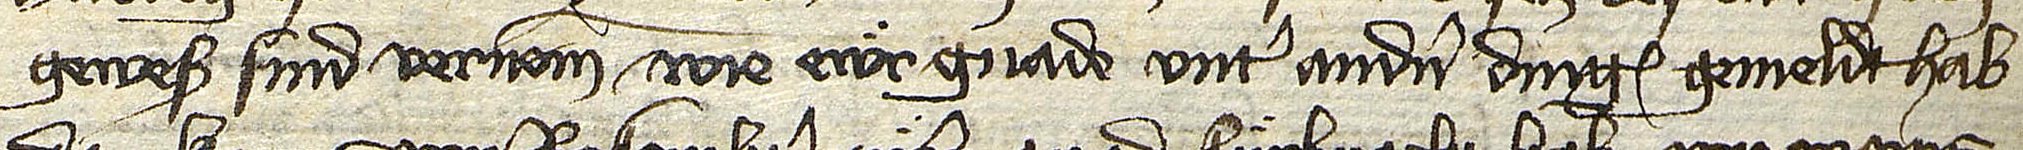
geweſ* ſind vernom* wie ewr gnade vnt* and*n ding* gemeldt hab
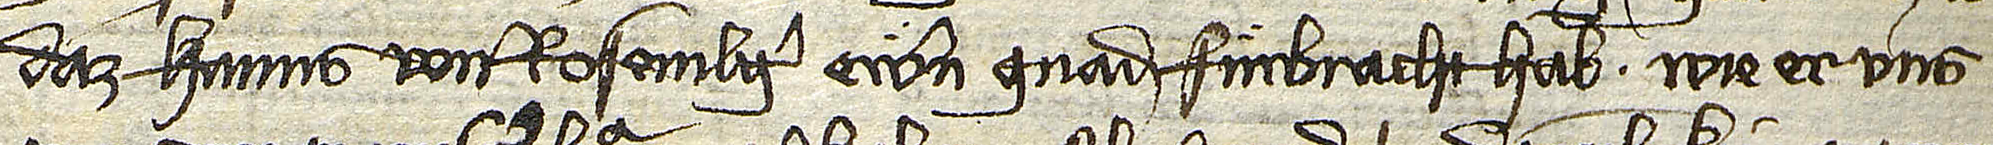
daʒ hanns von Roſemb*g ew*n gnad* fürbracht hab . wie er vns
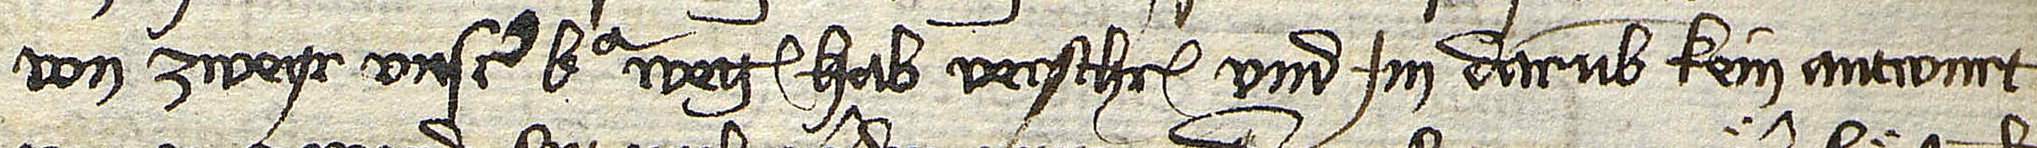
von ʒweyr vnſ*r b* weg* hab verſchr* vnd Im darub* kein antwurt
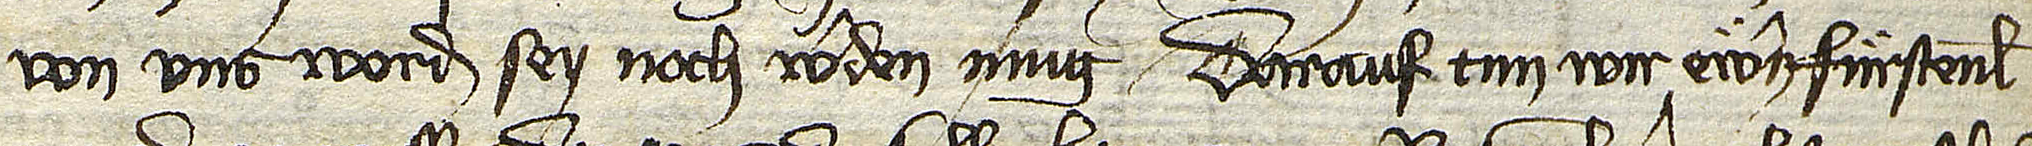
von vns word* ſey noch w*den mug / Darauf tun wir ew*n fürſtenl*
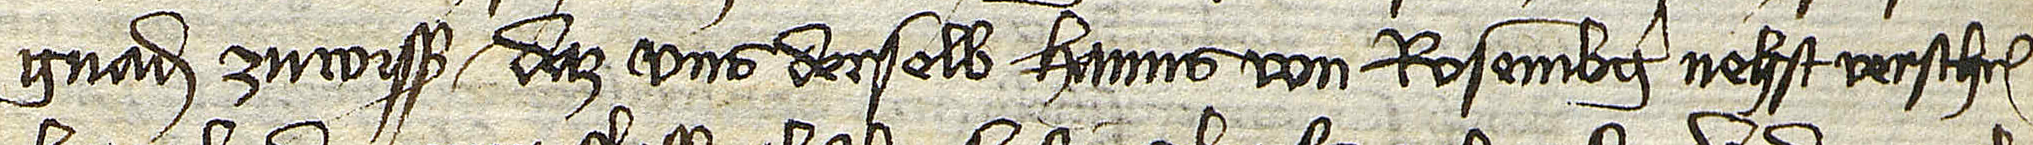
gnad* ʒuwiſſ* / daʒ vns derſelb hanns von Roſemb*g nehſt verſchr*
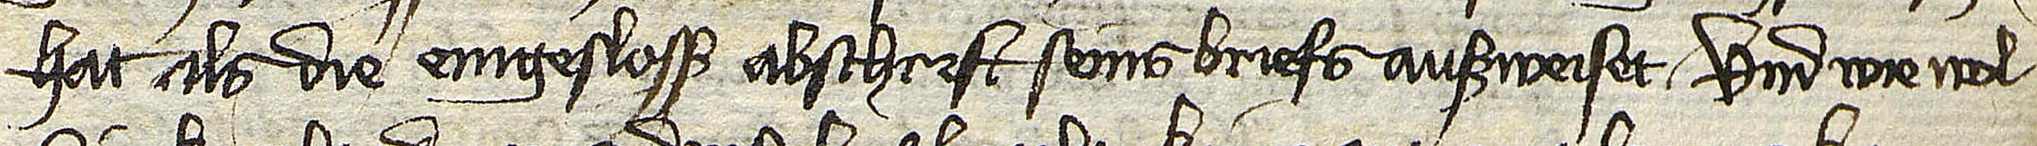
hat als die eingeſloſſ* abſchrift ſeins briefs auſʒweiſet / Vnd wie wol
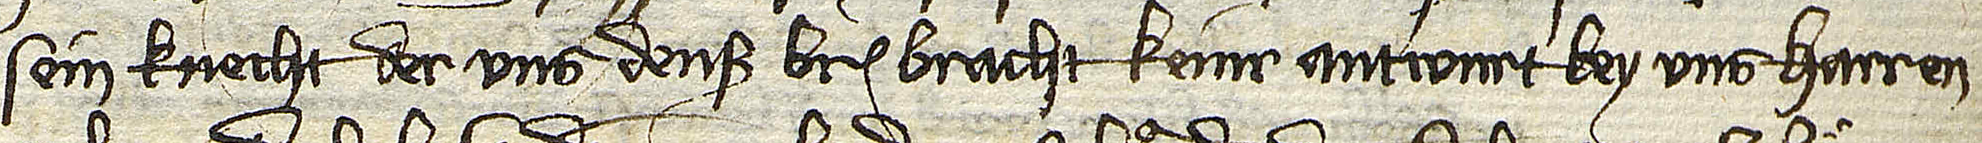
ſein knecht der vns denſ* br* bracht keinr antwurt bey vns harren
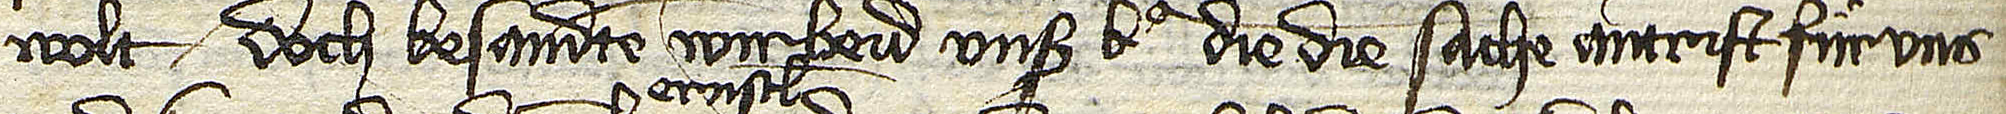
wolt / Doch beſandte* wir beid* vnſ* b* die die ſache antrift für vns
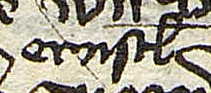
ernſtl*
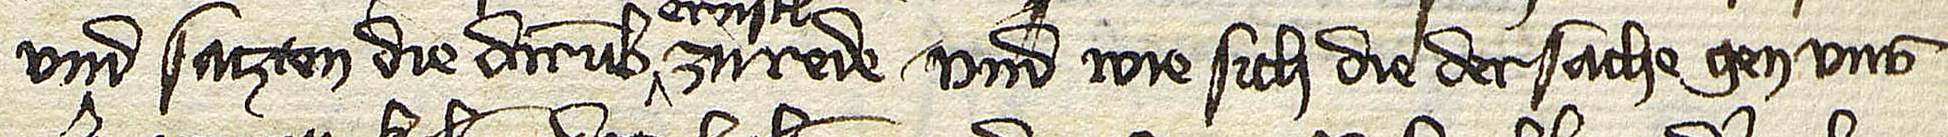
vnd ſacʒten die darub* ʒurede / vnd wie ſich die der ſache gen vns
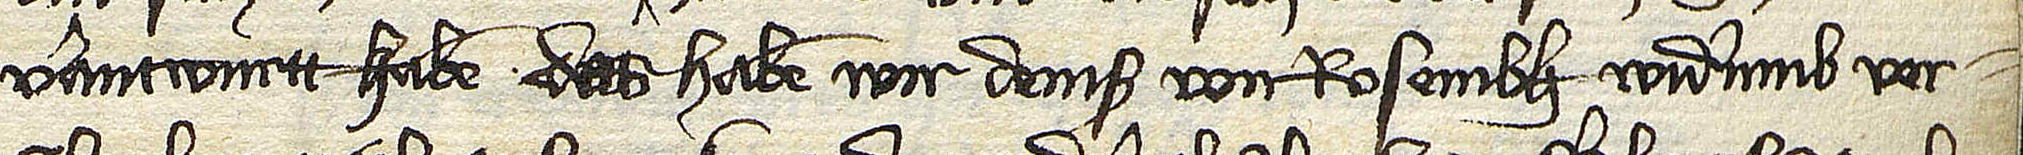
v*antwurtt habe* . das habe* wir demſ* von Roſemb*g wid*umb ver =
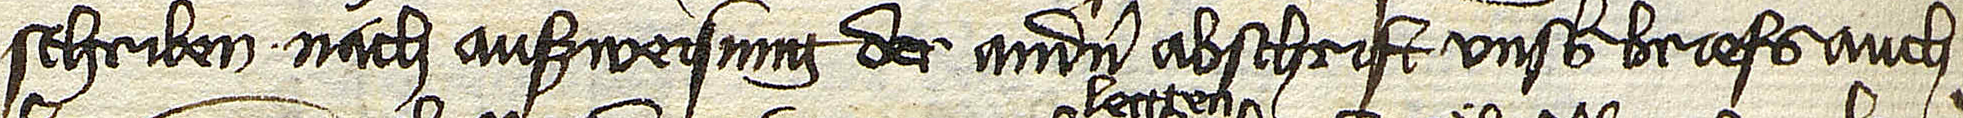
ſchriben . nach auſʒweiſung der and*n abſchrift vnſ*s briefs auch
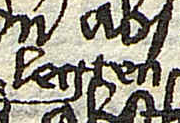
legten
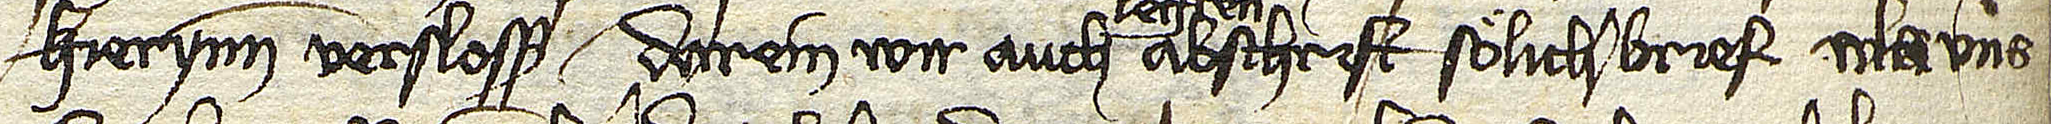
hierynn* verſloſſ* / Darein wir auch abſchrift ſölich* brief als vns
